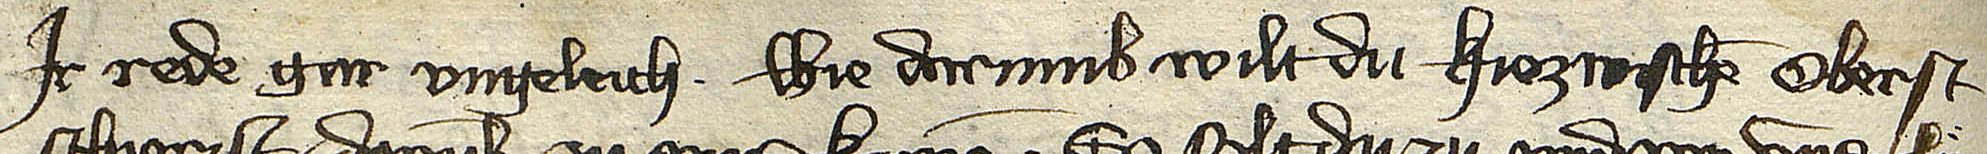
Ir rede gar vngeleich . wie darumb wilt du hieʒwiſche* Oberſt
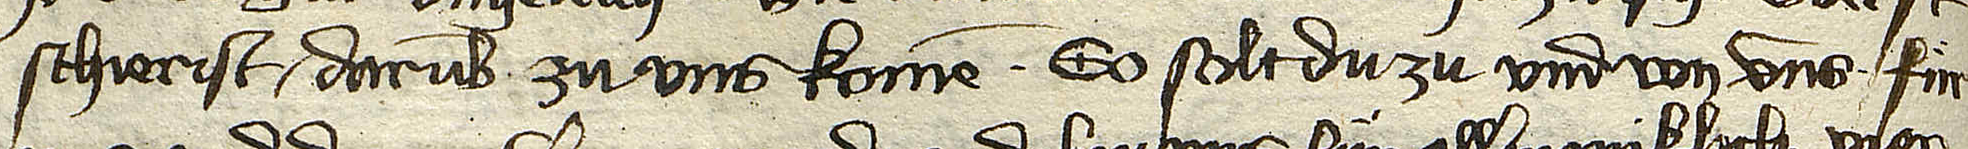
ſchieriſt / darub* ʒu vns kome* . So ſolt du ʒu vnd von vns . für
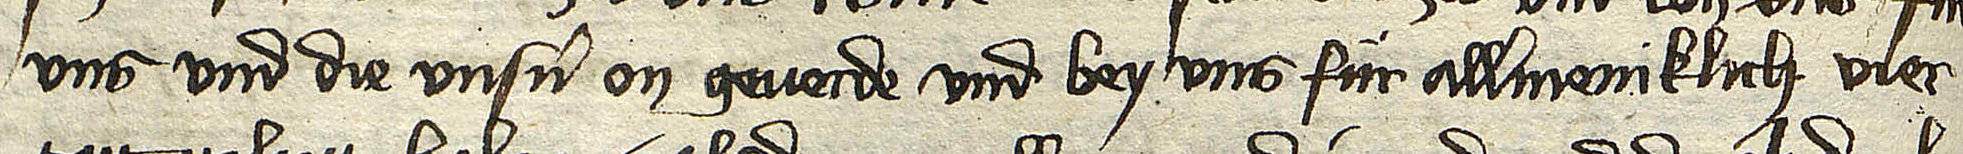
vns vnd die vnſ*n on geuerde vnd bey vns für all*meniklich vier
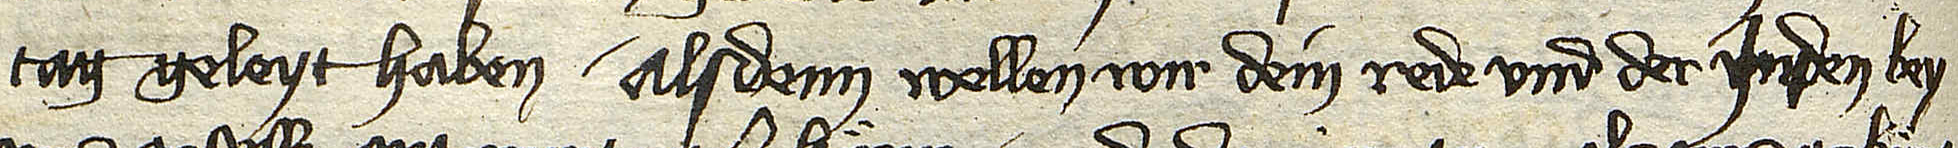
tag geleyt haben / alſdenn wellen wir dein rede und der Iuden bey
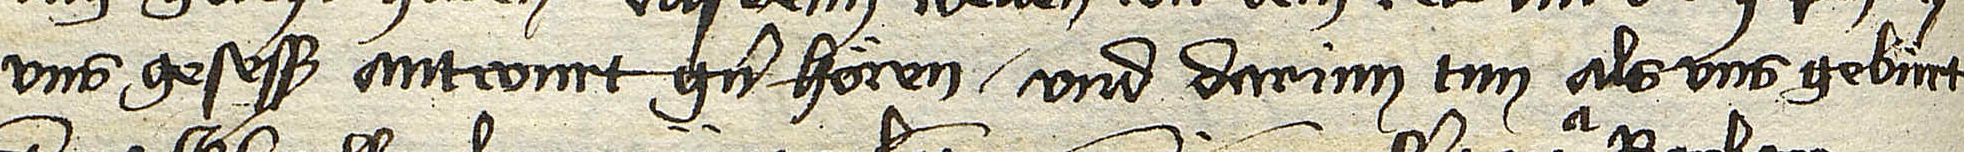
uns geſeſſ* antwurt gn* hören / vnd darinn tun als vns gebürt
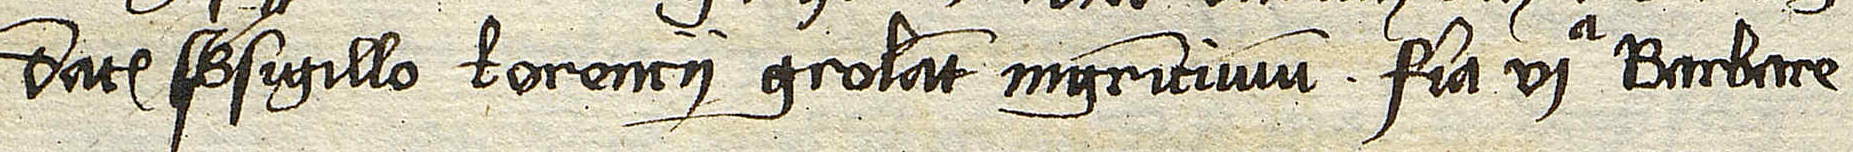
Dat* ſ*b ſigillo Lorencii grolat* mgr*ciuiu* . fia* vi* Barbare
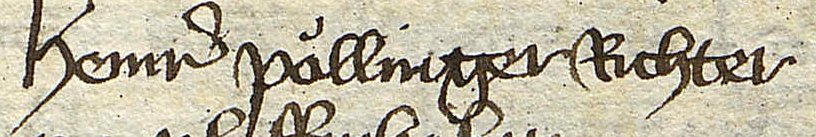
Heinr* Pöllinger Richter
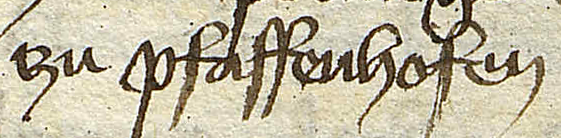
cʒu pfaffenhofen
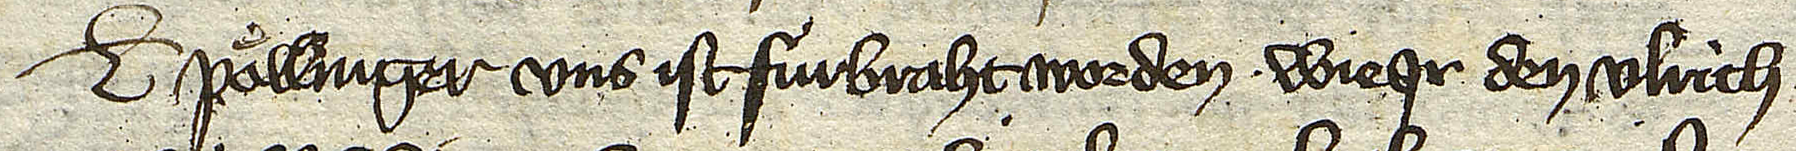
L* pöllinger vns ist fürbraht worden wie Ir den vlrich
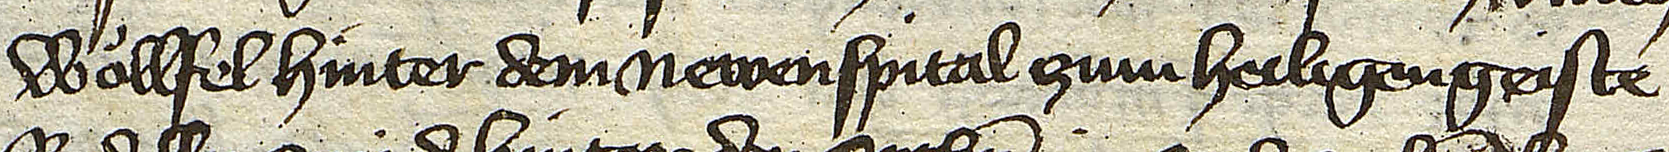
wöllfel hinter dem Newenſpital ʒum heiligen geiſte
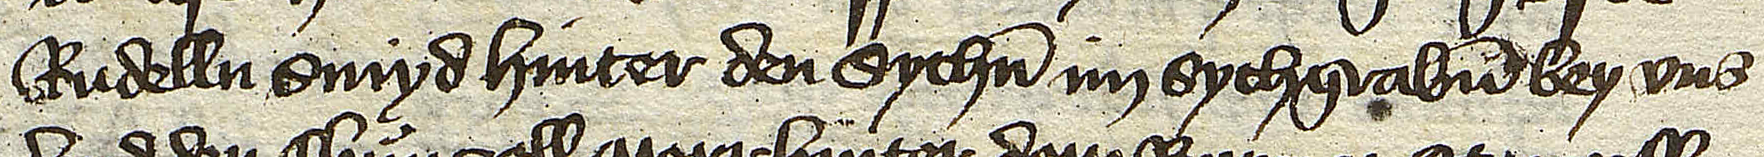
Rudelln Smyd hinter den Sychn* im Sychgrabn* bey uns
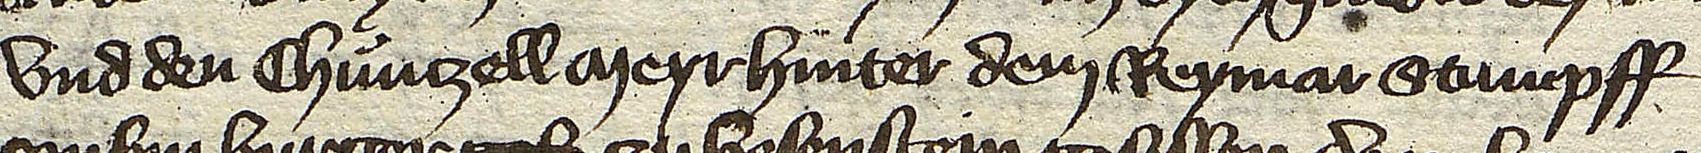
vnd den Chüncʒell Meyrhinter dem Reymar Stumpff
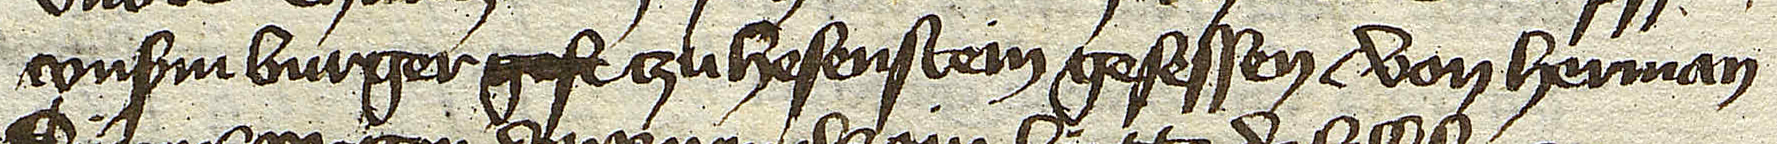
vnſ*m burger geſc ʒu heſenſtein geſeſſen / von herman
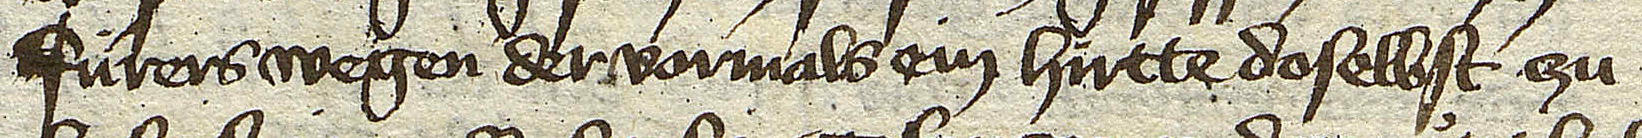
Fürers wegen der vormals ein hirtte doſelbſt cʒu
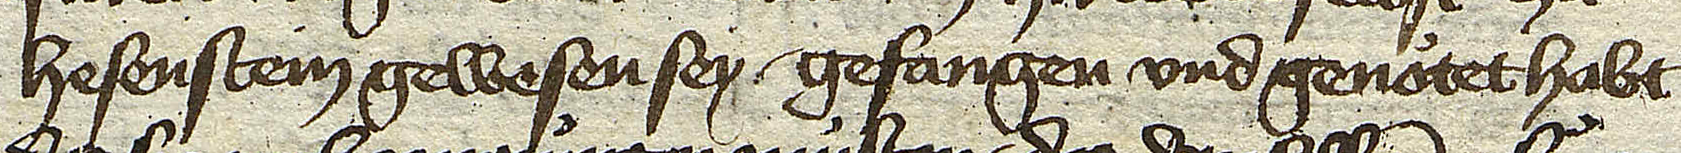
heſenſtein geweſen ſey / gefangen vnd genötet habt
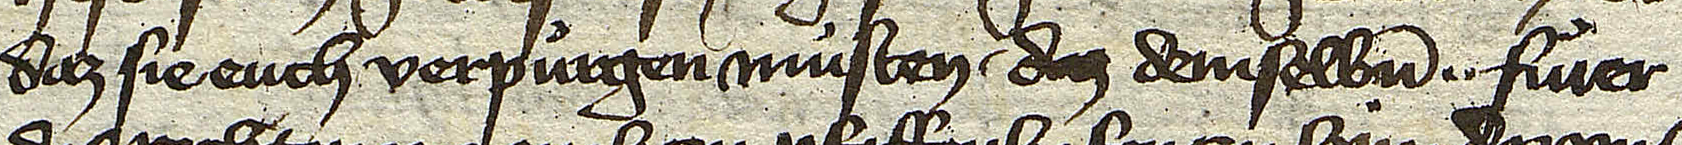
daʒ ſie euch verpürgen müſten / daʒ demſelb*n ~ fürer
